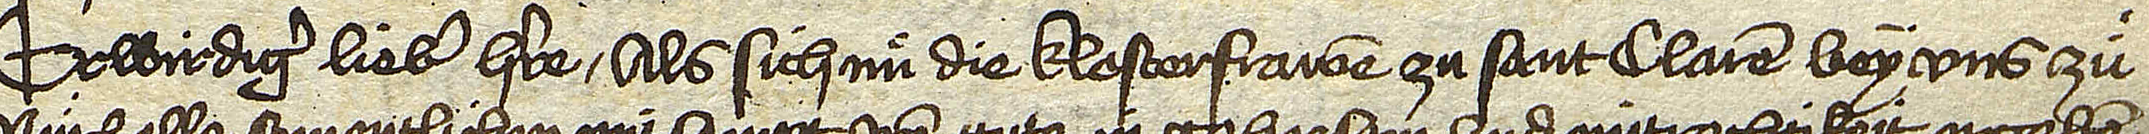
Erwirdig* lieb* h*re / Als ſich nü die kloſterfrawe* cʒu ſant Clare* bey vns cʒü
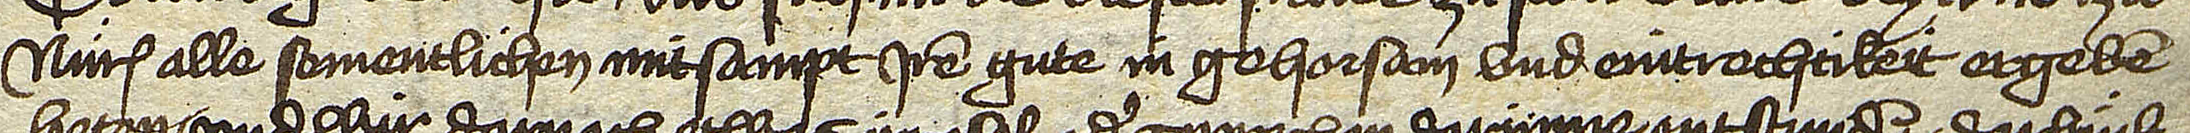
Nür* alle ſementlichen mitſampt Ire* gute in gehorſam vnd eintrechtikeit ergebe*
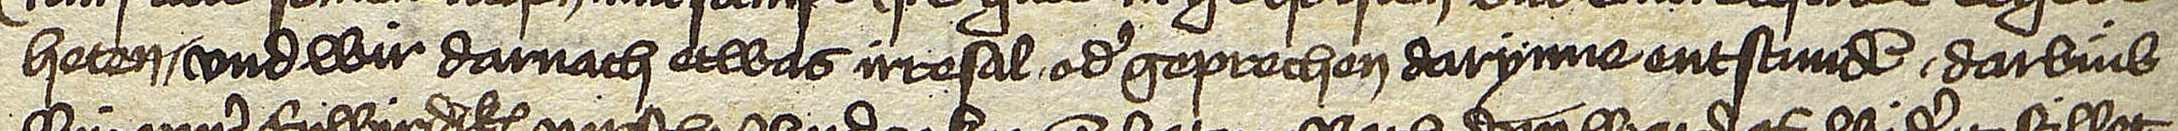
heten / vnd wir darnach etwas irreſal od* geprechen darynne entſtund* / darv̈mb
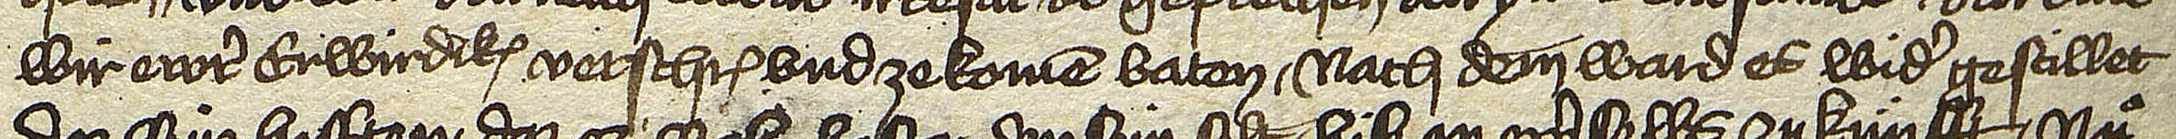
wir ewr* Erwirdik* verſchr* vnd cʒekome* baten / Nach dem ward es wid* geſtillet
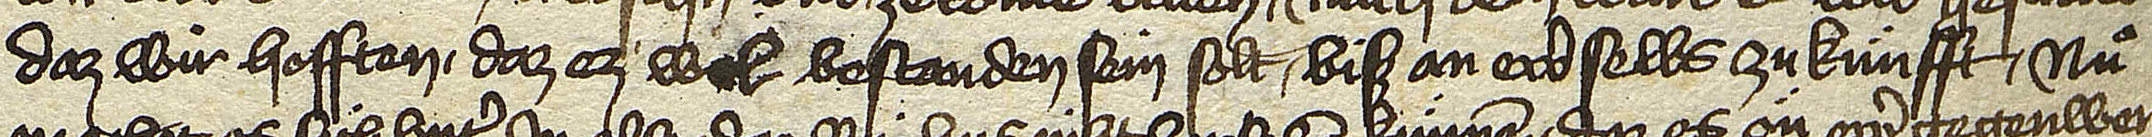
daʒ wir hofften / daʒ eʒ wol beſtanden ſein ſolt / biſʒ an ew* ſelbs cʒukünfft / Nü
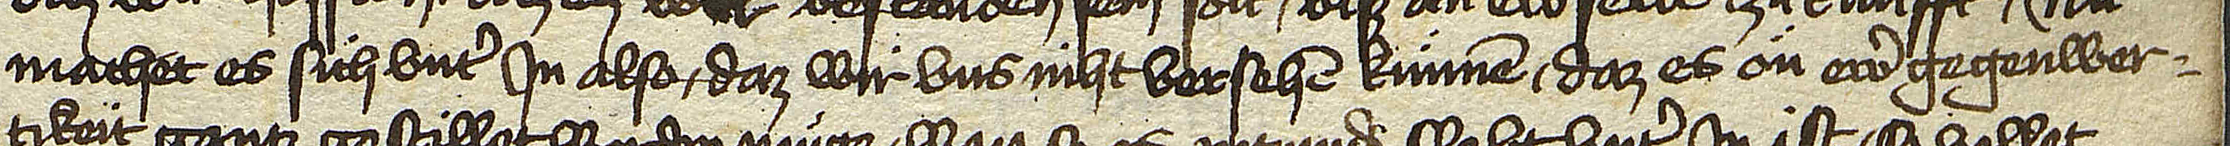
machet es ſich vnt* In alſo / daʒ wir vns niht verſehe* künne* / daʒ es ön ew* gegenwer =
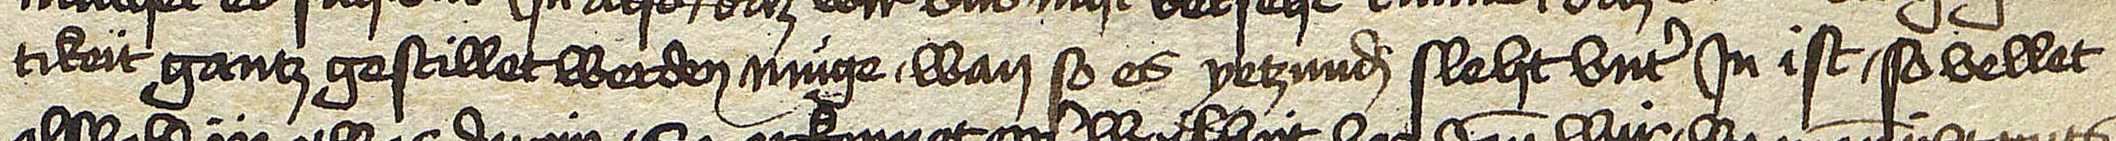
tikeit gantʒ geſtillet werden müge / wan ſo es yetʒund* ſleht vnt* In iſt / ſo vellet
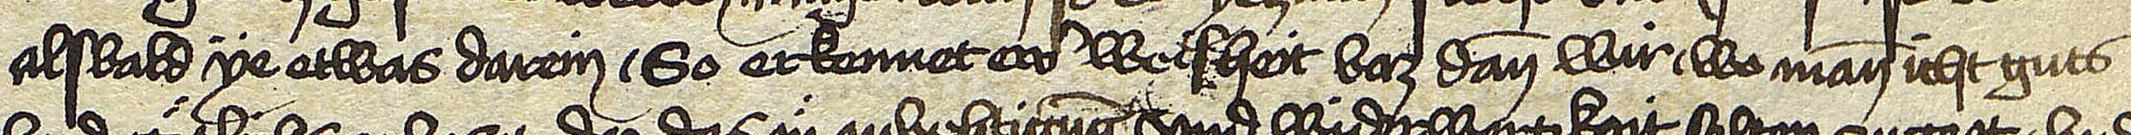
alſbald ye etwas darein / So erkennet ew* weiſheit baʒ dan* wir / wo man* icht guts
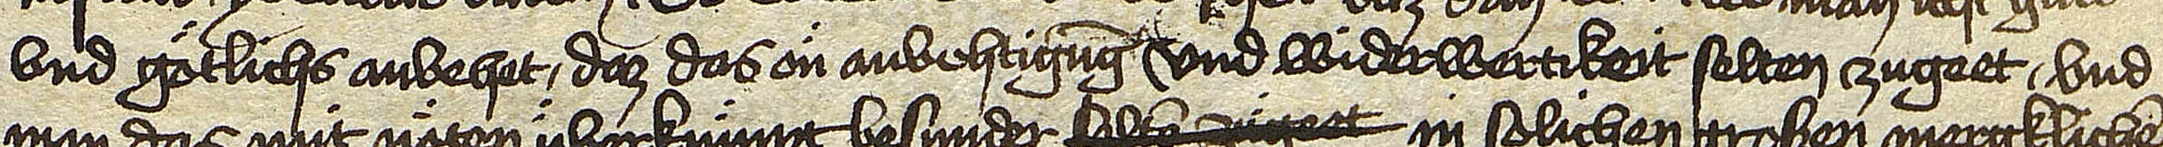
vnd götlichs anvehet / daʒ das ön anvehtigug* vnd widerwertikeit ſelten cʒugeet / vnd
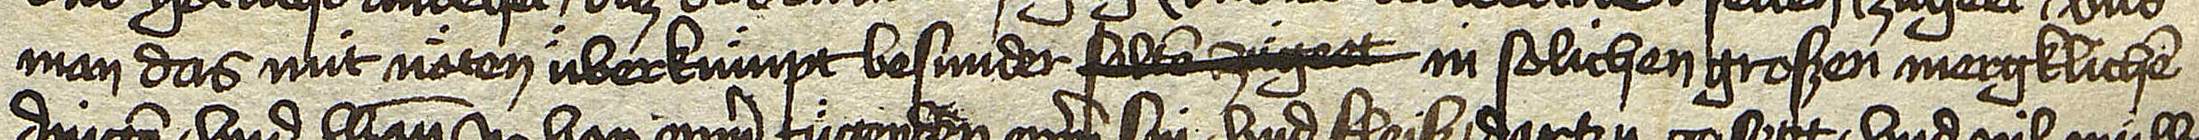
man das mit nöten überkümpt beſunder ſelte* cʒügeet in ſolichen groſʒen mergkliche*
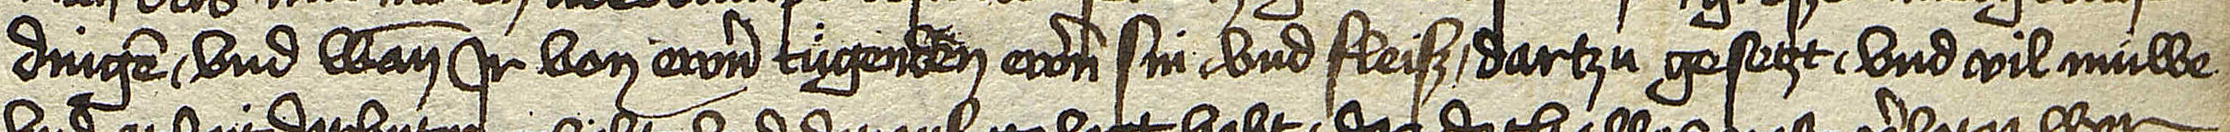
dinge* / vnd wan* Ir von ewn* tügenden ewn* ſin / vnd fleiſʒ / dartʒu geſetʒt / vnd vil müwe
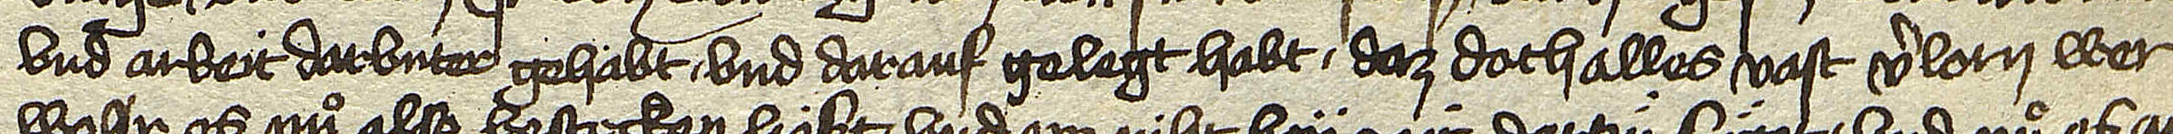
vnd arbeit darvnter gehabt / vnd darauf gelegt habt / daʒ doch alles vaſt v*lorn wer
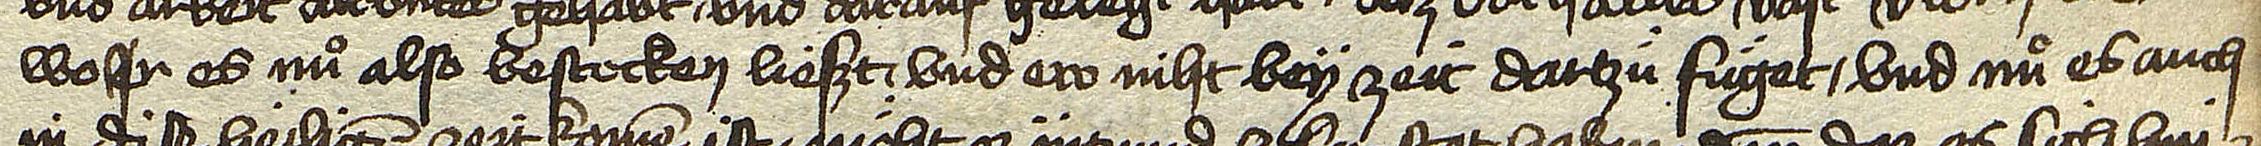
wo Ir es nü alſo beſtecken lieſʒt / vnd ew niht bey cʒeit dartʒü füget / vnd nü es auch
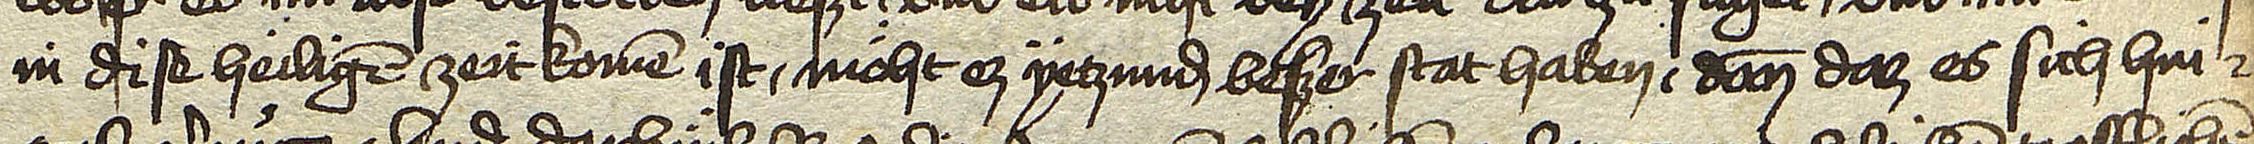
in diſe heilige* cʒeit kome* iſt / möht eʒ yetʒund* beſʒer ſtat haben / dan* daʒ es ſich hin =
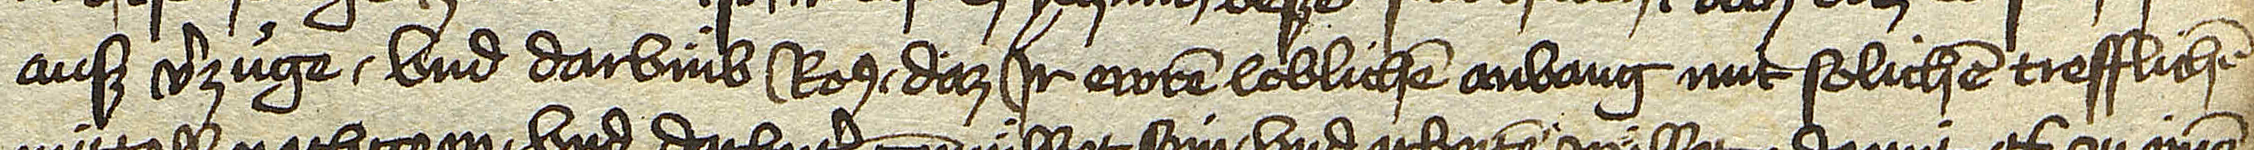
auſʒ v*ʒüge / vnd darv̈mb Ro* / daʒ Ir ewre* lobliche* anvang mit ſoliche* treffliche*
